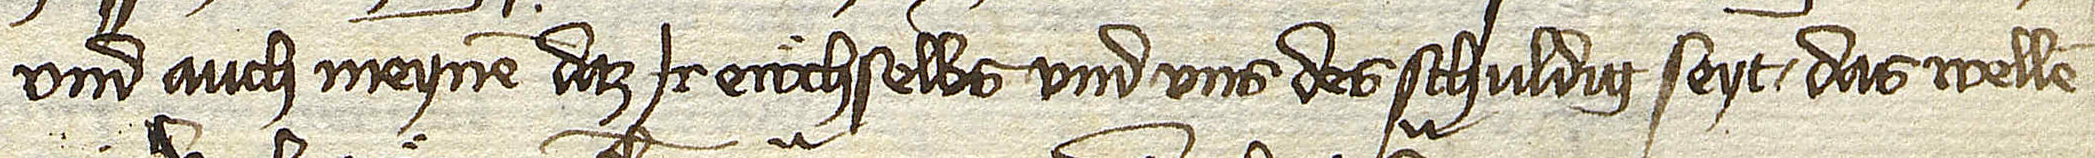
vnd auch meyne* daʒ Ir ewch ſelbs vnd vns des ſchuldig ſeyt / das welle*
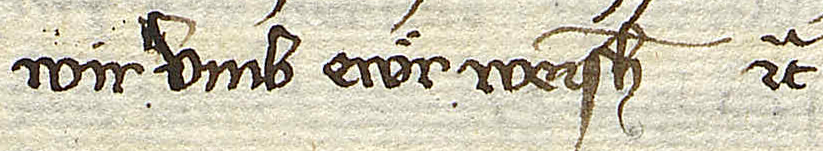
wir Vmb ewr weiſh* ec*
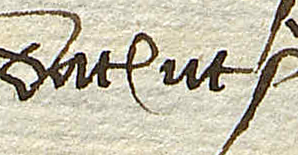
Dat* ut ſ*
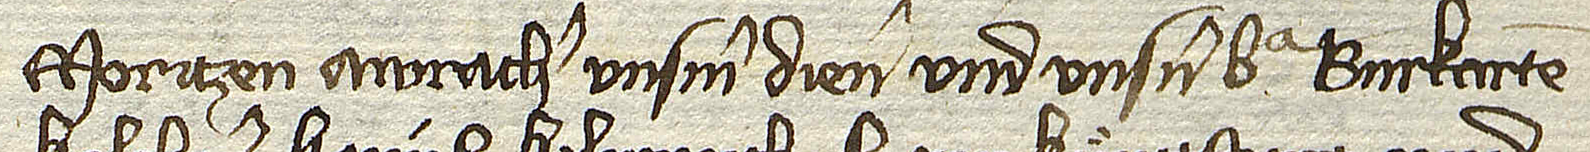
Moricʒen awrach* vnſ*m dien* vnd vnſ*n b* Burkarte*
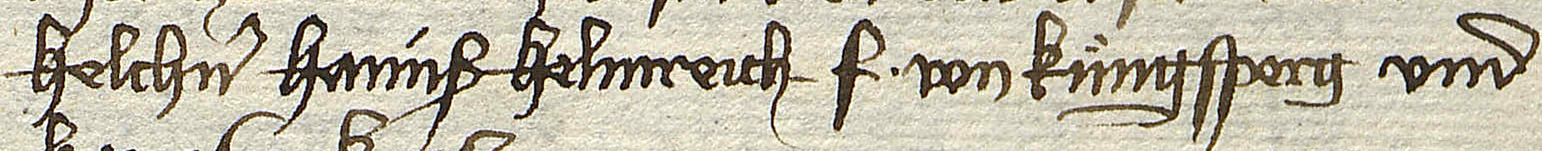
Helchn* hannſ* Helmreich F. von küngſperg vn
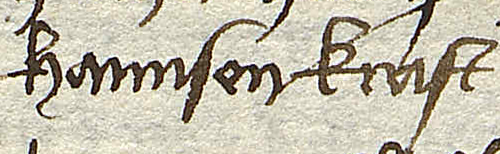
Hannſen Kraft
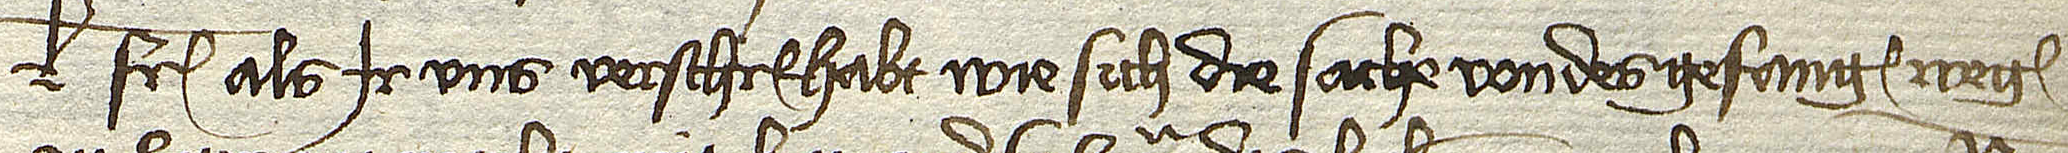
L* fr* als Ir vns verſchr* habt wie ſich die ſache von des gefang* weg*
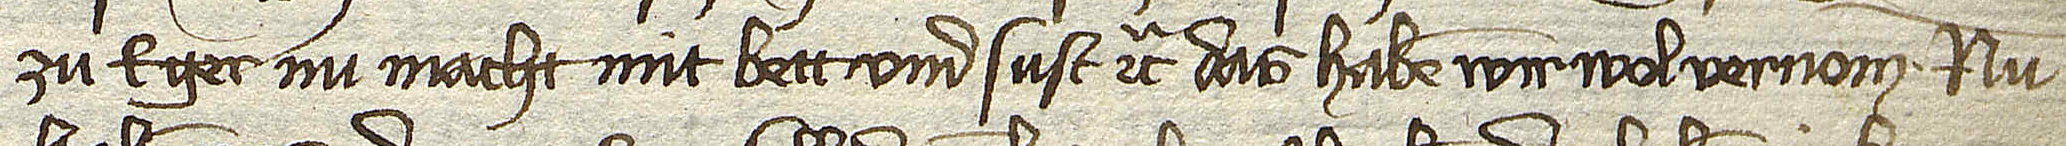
ʒu Eger nu macht mit bett vnd ſuſt ec* das habe* wir wol vernom* . Nu
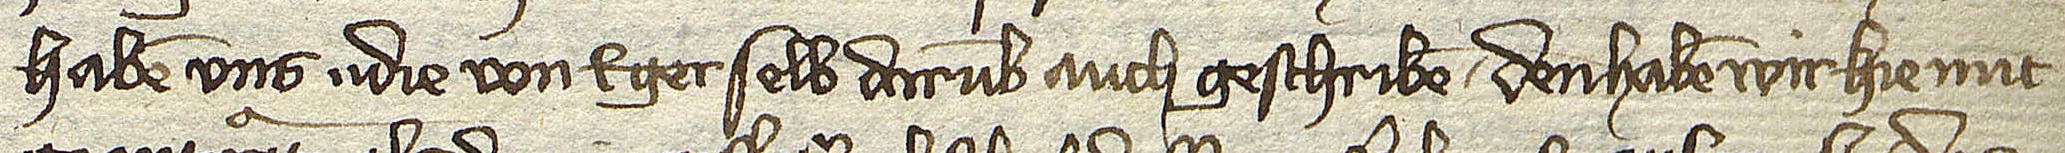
habe* vns ~ die von Eger ſelb daru*b auch geſchribe* / den habe* wir hiemit
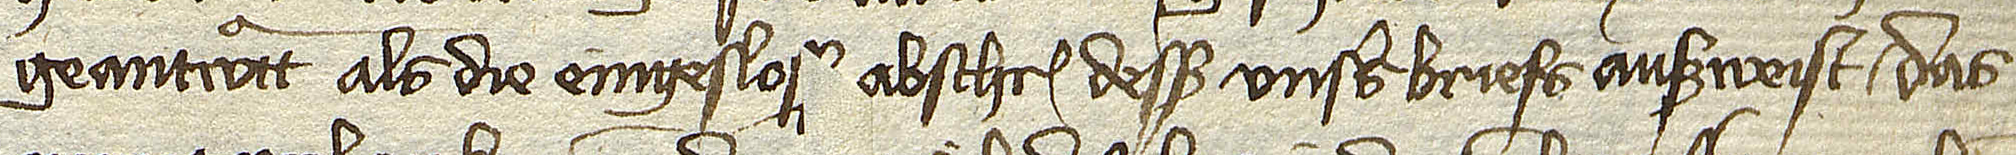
geantw*tt als die eingeſloſſ* abſchr* deſſ* vnſ*s briefs auſʒweiſt / das
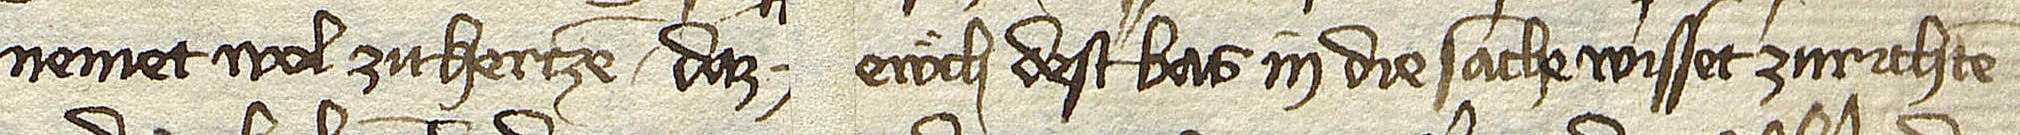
nemet wol ʒu hercʒe* / daʒ Ir ewch deſt bas in die ſache wiſſet ʒurichte*
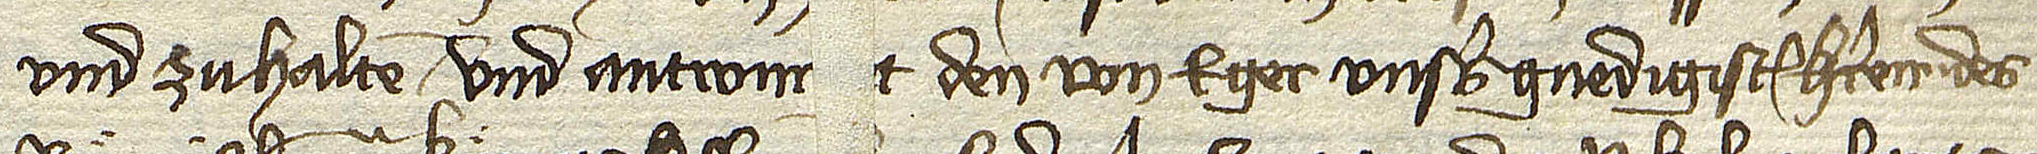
vnd ʒuhalte* / Vnd antwurtt den von Eger vnſ*s gnedigiſt* H*ren ~ des
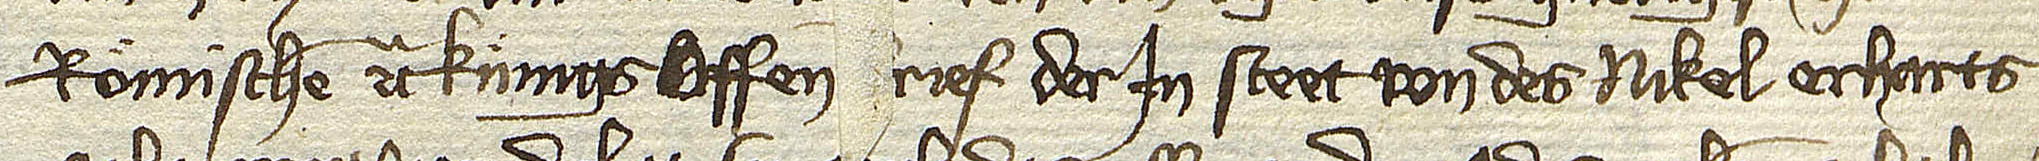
Römiſche* ec* künigs Offenbrief der In ſteet von des Nikel erharts
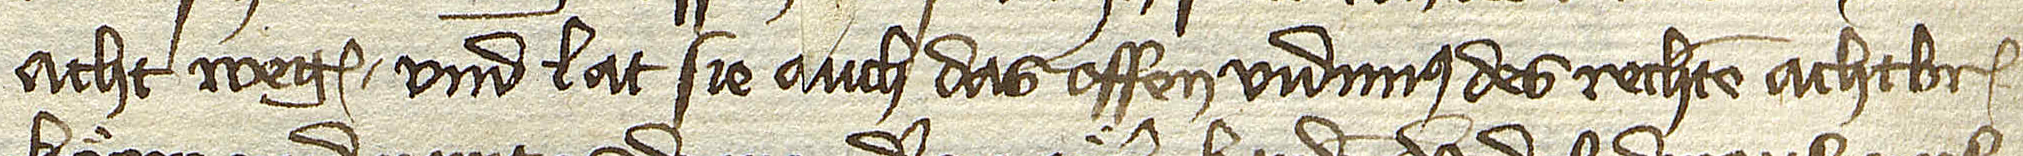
acht weg* / vnd lat ſie auch das offen vidim* des rechte* achtbr*
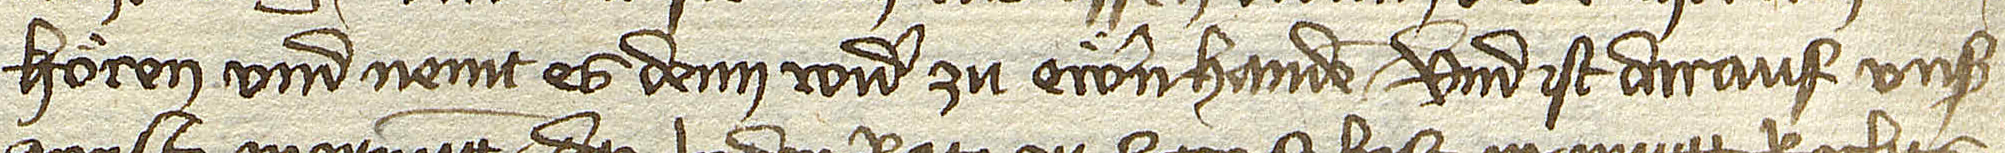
hören vnd nemt es denn wid* ʒu ew*n hande* / Vnd iſt darauf vnſ*
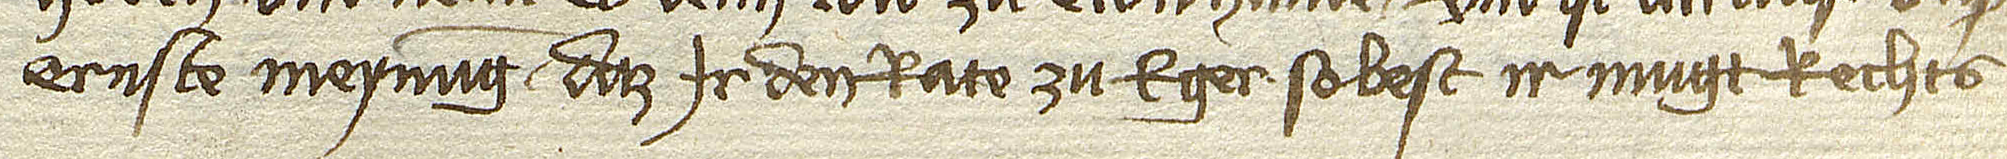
ernſte meynu*g / daʒ Ir den Rate ʒu Eger . ſo beſt ir mugt Rechts
